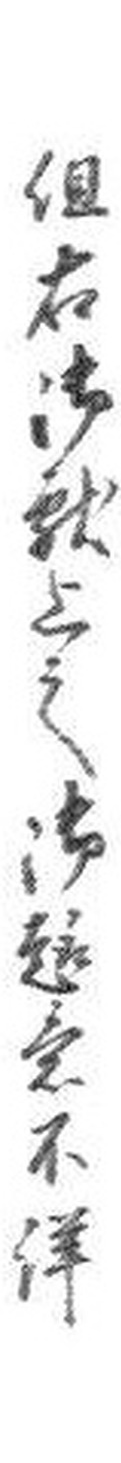但右御献上之御趣意不詳
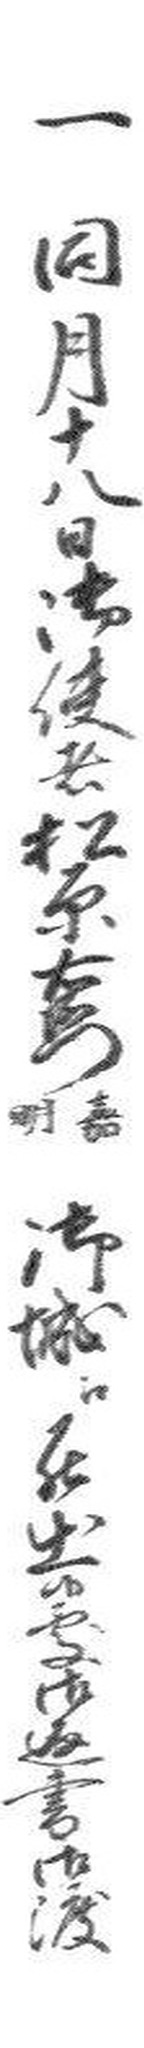一同月十八日御使者松原右衛門嘉明御城江罷出候処御返書御渡
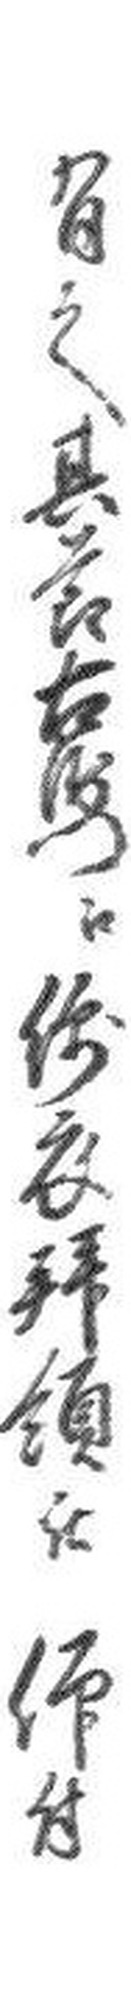有之其節右衛門江綿衣拝領被仰付
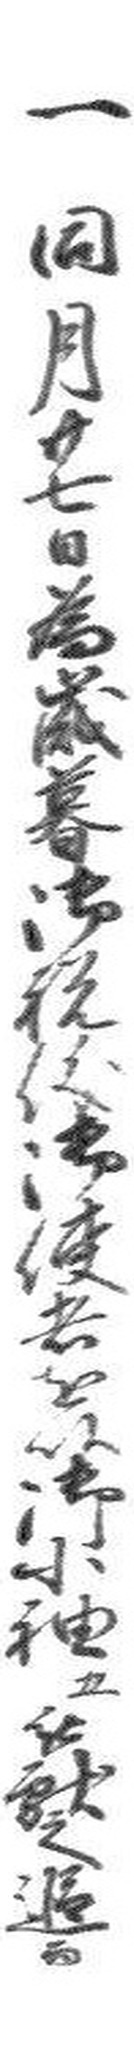一同月廿七日為歳暮御祝儀御使者を以御小袖五被献之追而

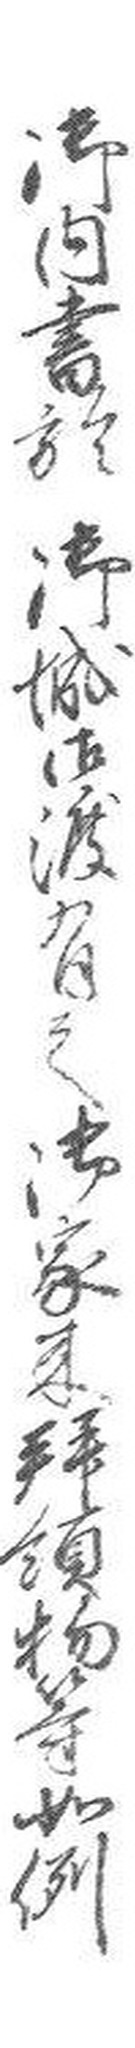御内書於御城御渡有之御家来拝領物等如例
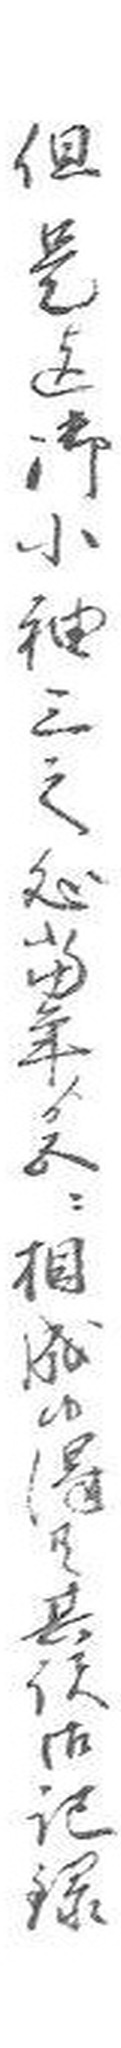但是迄御小袖三之処当年ゟ五ニ相成候得共其訳御記録
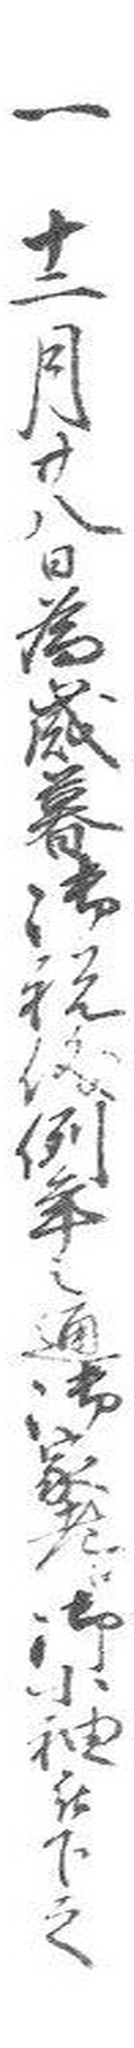一十二月廿八日為歳暮御祝儀例年之通御家老江御小袖被下之
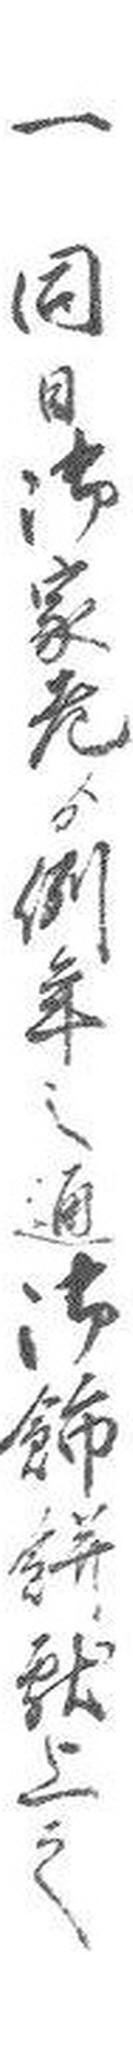一同日御家老ゟ例年之通御飾餅献上之
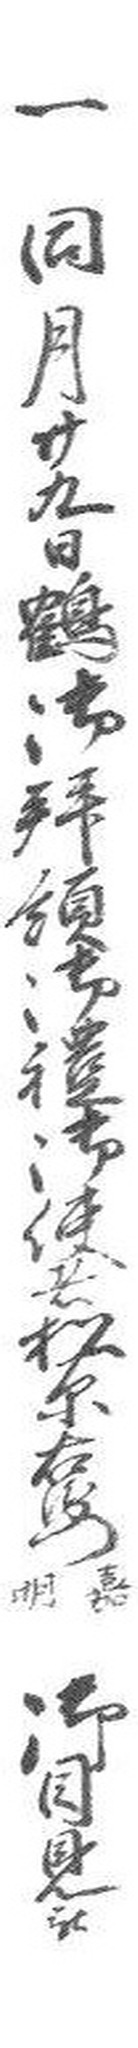一同月廿九日鶴御拝領御礼御使者松原右衛門嘉明御目見被
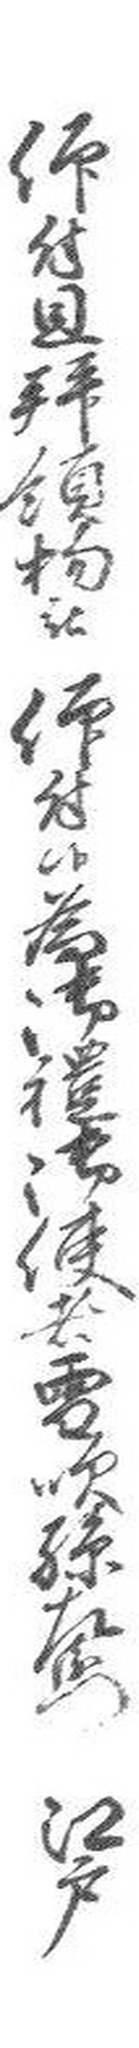仰付且拝領物被仰付候為御礼御使者雪吹孫左衛門江戸
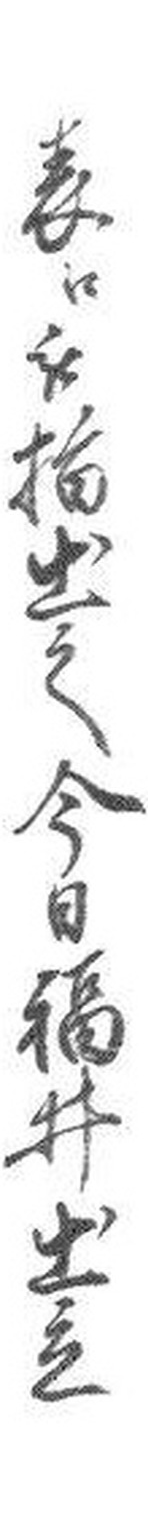表江被指出之今日福井出立
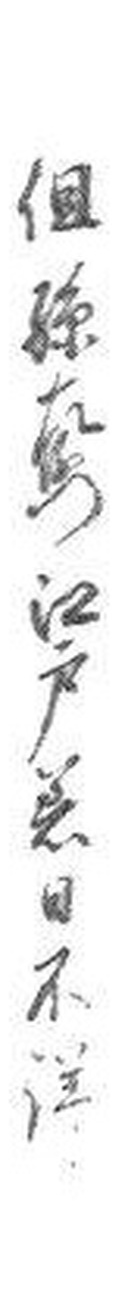但孫左衛門江戸着日不詳
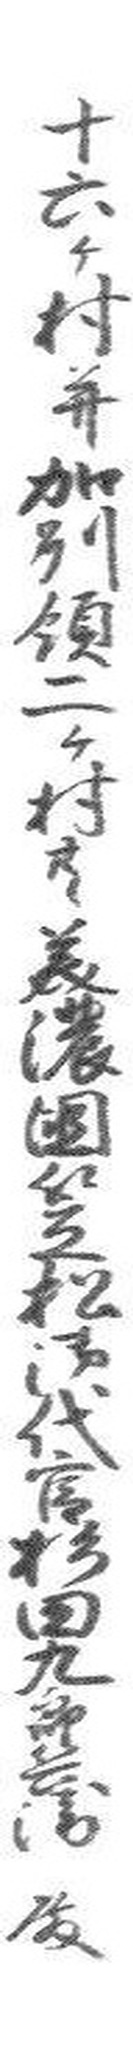十六ヶ村幷加州領二ヶ村共美濃国笠松御代官杉田九郎兵衛殿
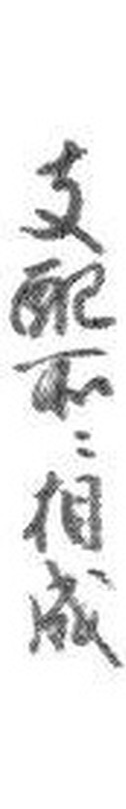支配所ニ相成
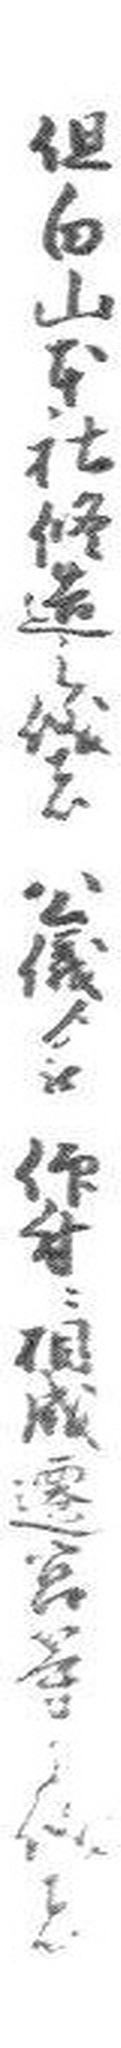但白山本社修造之儀者公儀ゟ被仰付ニ相成遷宮等之儀者
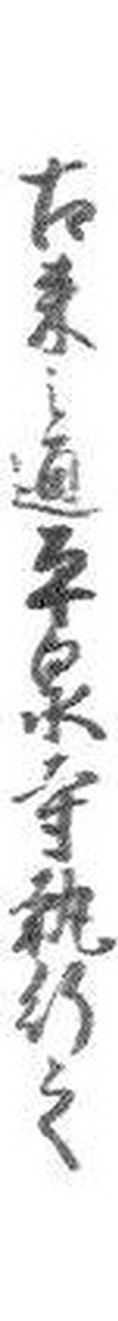古来之通平泉寺執行之
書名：家譜 七 光通公 従寛文四年到同九年
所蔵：福井県文書館 Fukui Prefectural Archives
